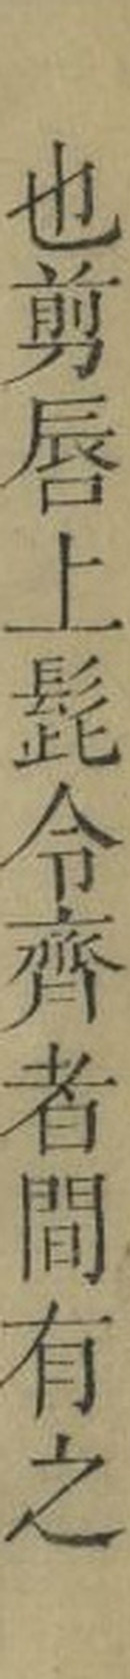也剪唇上髭令斉者間有之
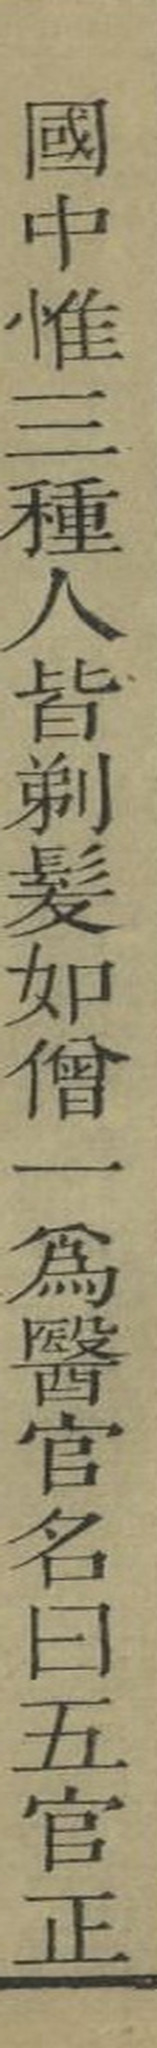国中惟三種人皆剃髪如僧一為医官名曰五官正
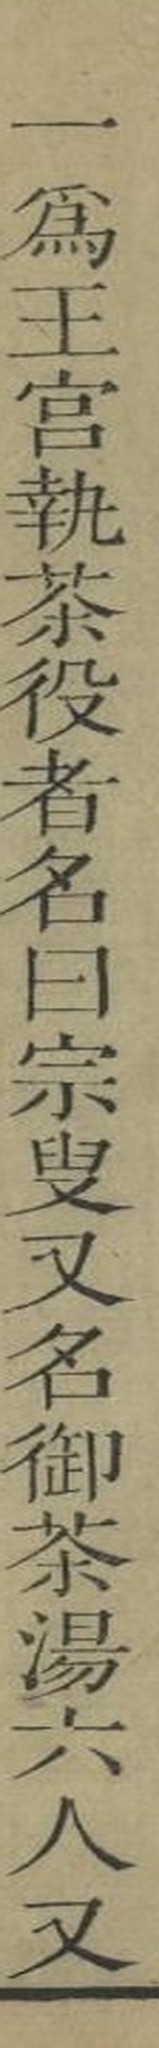一為王宮執茶役者名曰宗叟又名御茶湯六人又
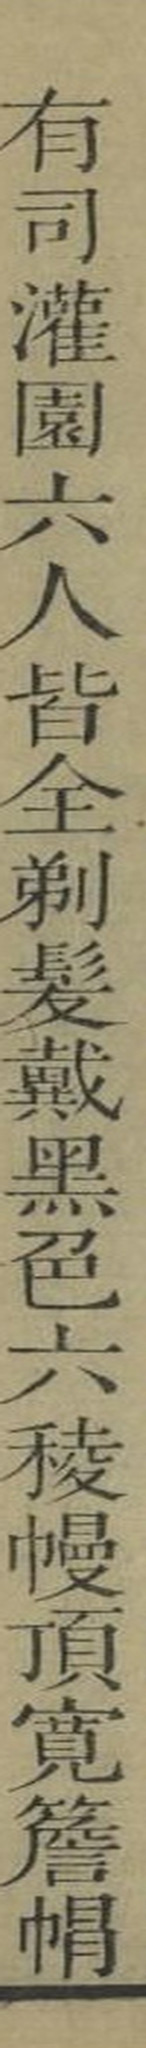有司灌園六人皆全剃髪戴黒色六稜幔頂寛簷帽
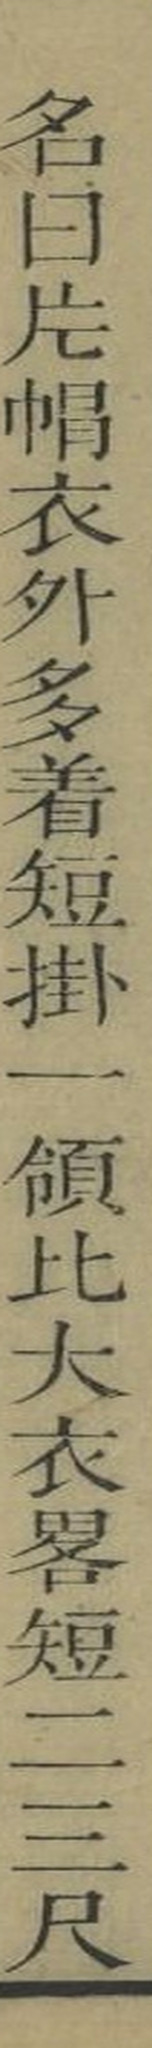名曰片帽衣外多着短掛一領比大衣略短二三尺
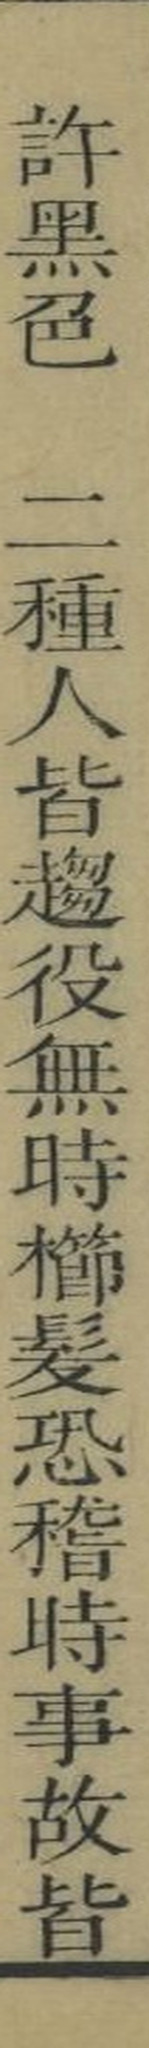許黒色二種人皆趨役無時櫛髪恐稽時事故皆
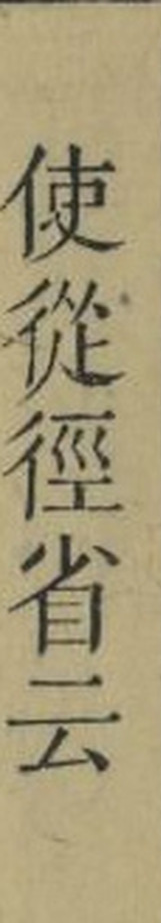使従径省云

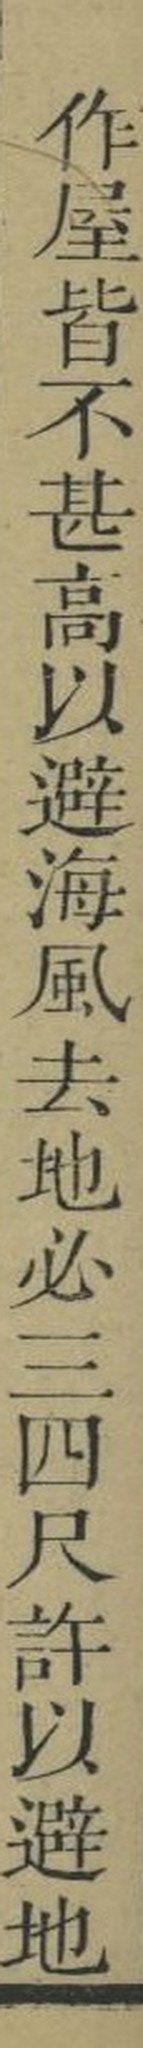作屋皆不甚高以避海風去地必三四尺許以避地
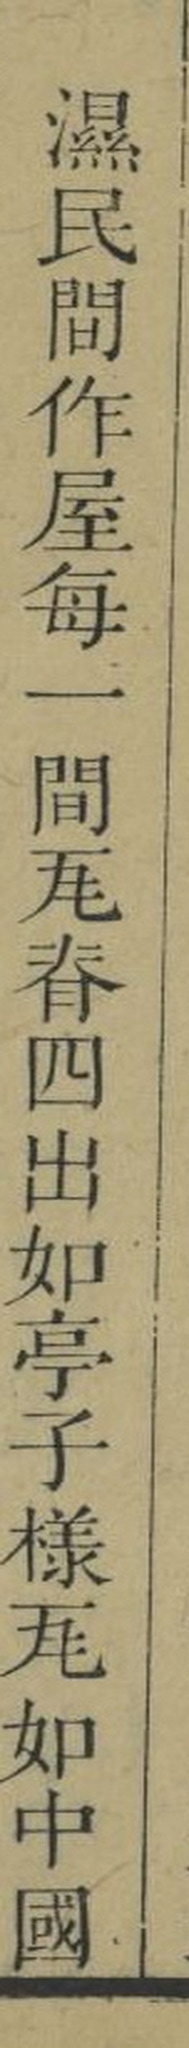湿民間作屋毎一間瓦脊四出如亭子様瓦如中国
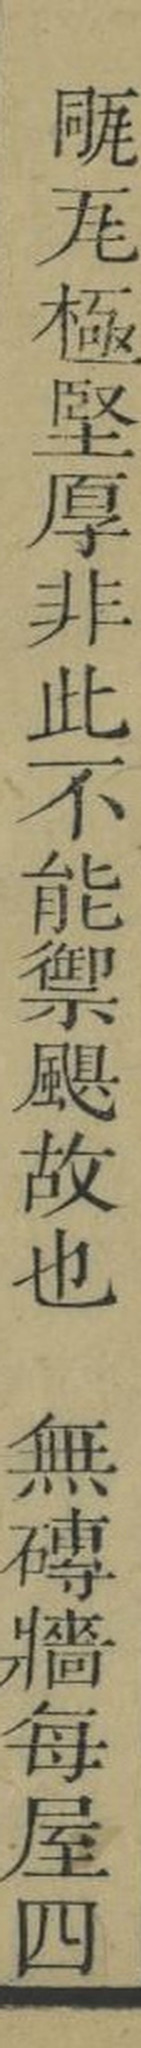瓦極堅厚非此不能禦颶故也無磚牆毎屋四
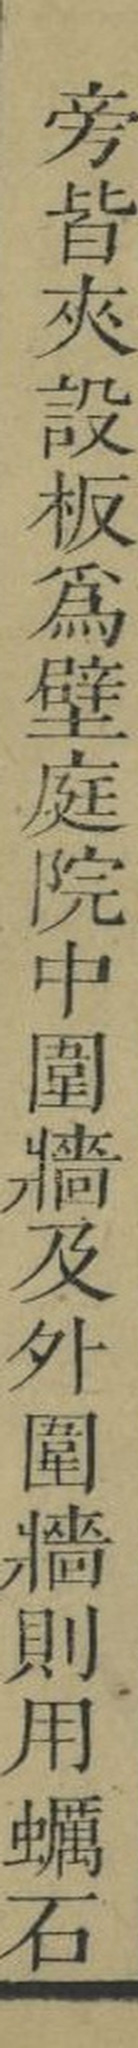旁皆夾設板為壁庭院中囲牆及外囲牆則用蠣石
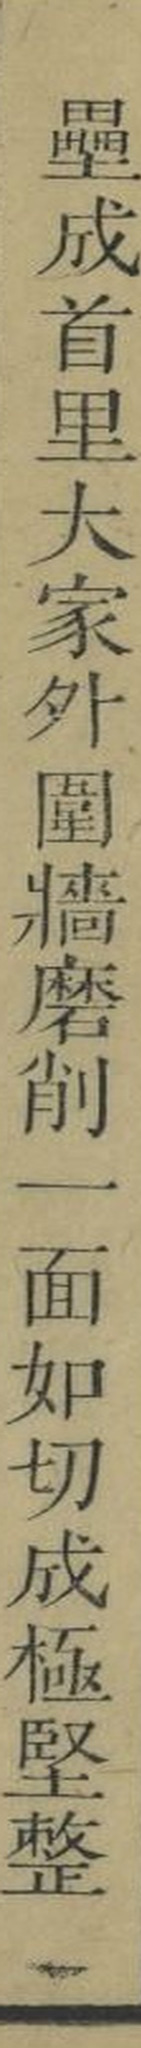壘成首里大家外囲牆磨削一面如切成極堅整
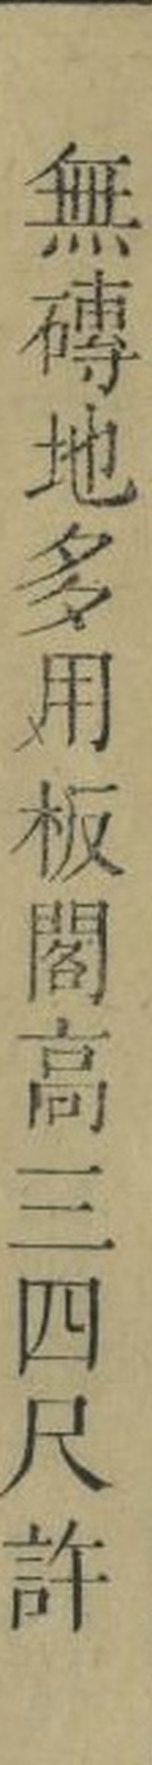無磚地多用板閣高三四尺許
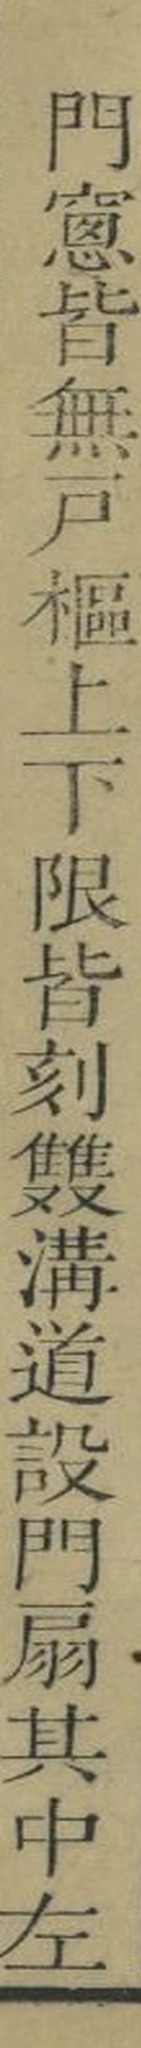門窓皆無戸枢上下限皆刻双溝道設門扇其中左
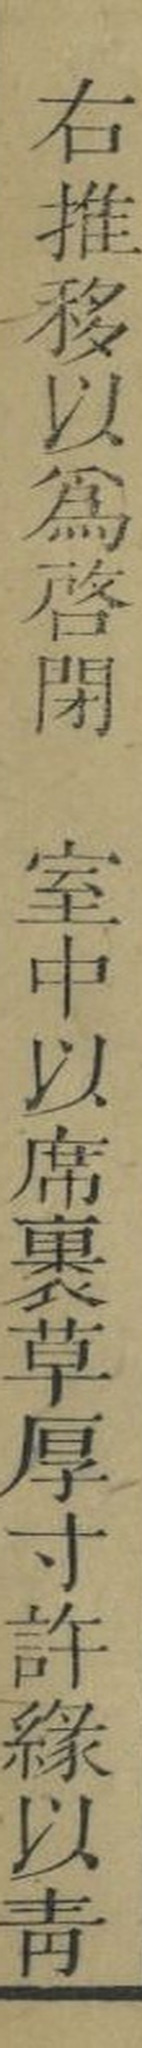右推移以為啓閉室中以席裹草厚寸許縁以青

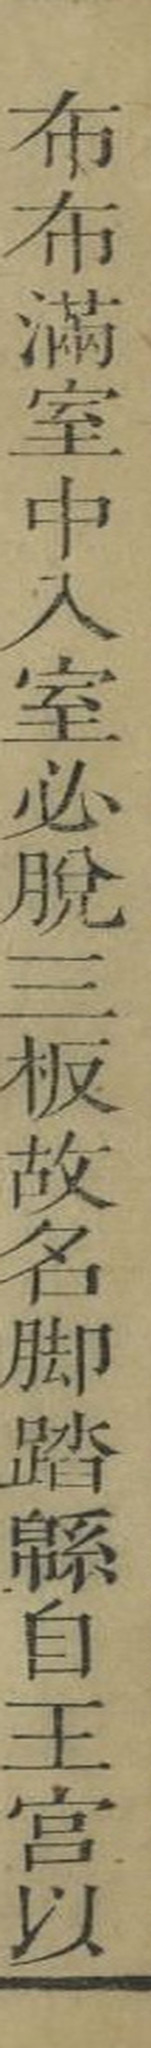布布満室中入室必脱三板故名脚踏綿自王宮以
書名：中山伝信録 巻六
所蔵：University of the Ryukyus Library
